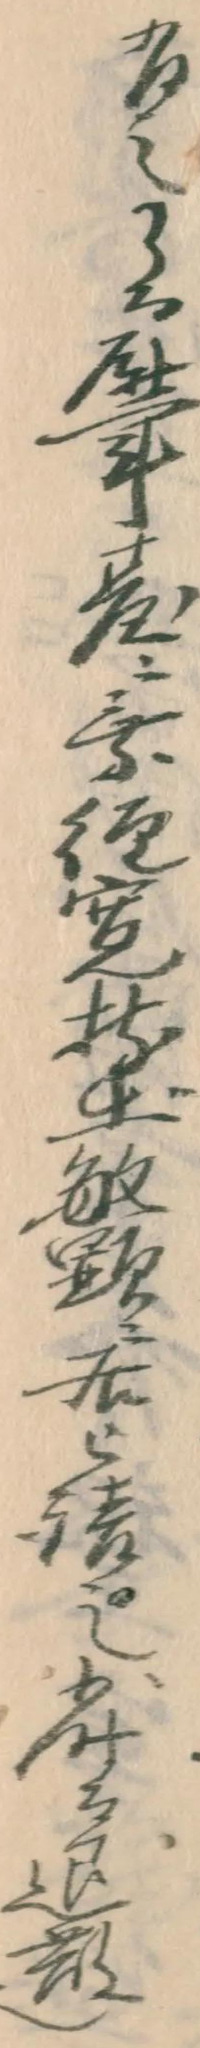有之了而熨斗臺ニ乗経寛持出敏顕ニ居被請也少時而退散也
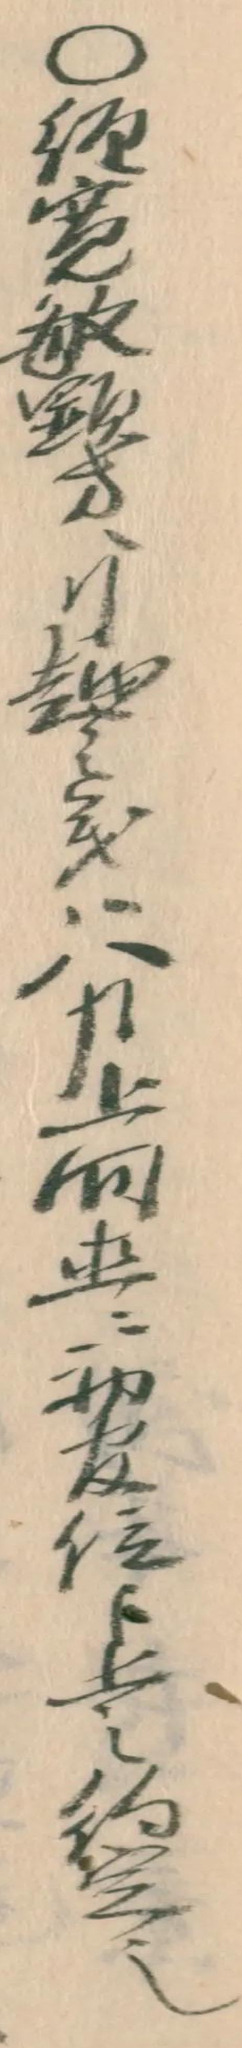○経寛敏顕方へ引越之義ハ八月上旬直ニ初官位申上之約定也
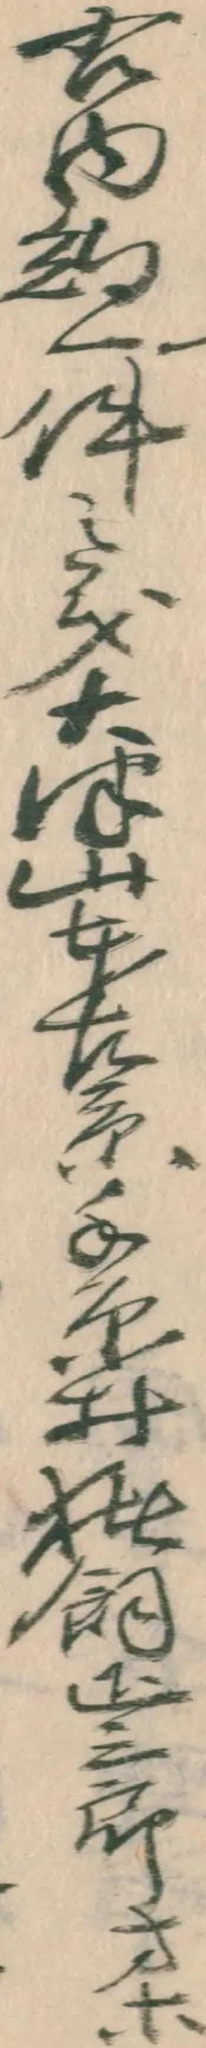右内約一件之義大津山本左京手原村猪飼正三郎方等
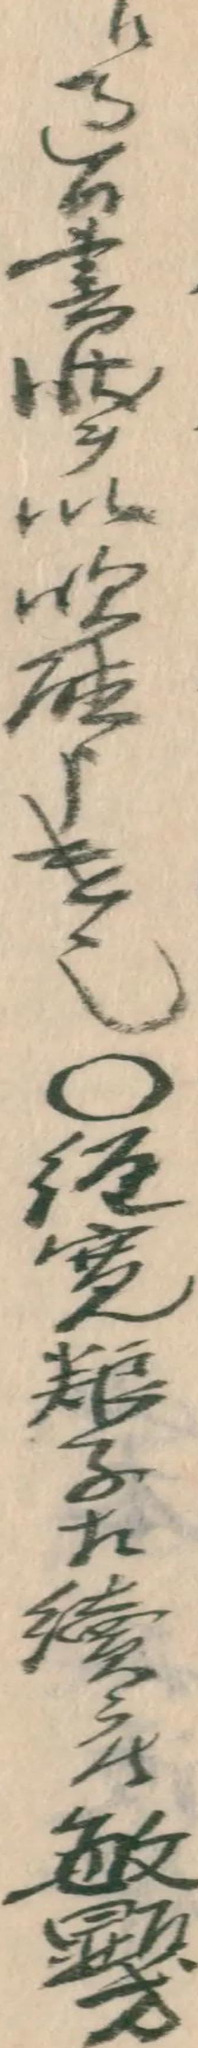え過日書状を以吹聴申遣也○経寛養子相續ニ付敏顕方
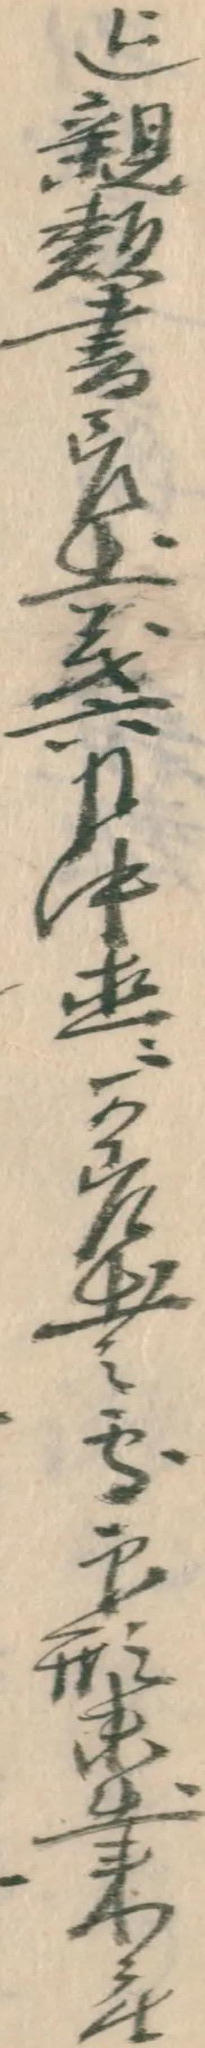迄親類書差出義六月中直ニ可差出之處印形未出来ニ付
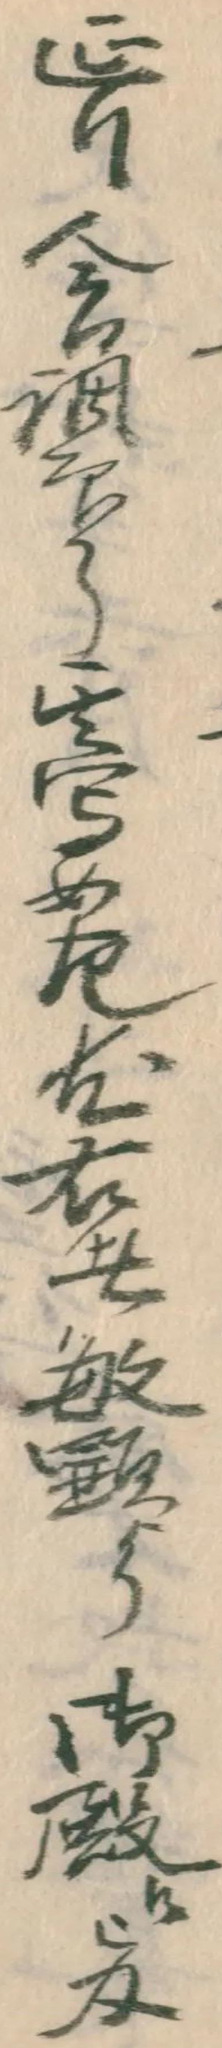延引今日調印了其写如左尤右者敏顕より御殿え被及
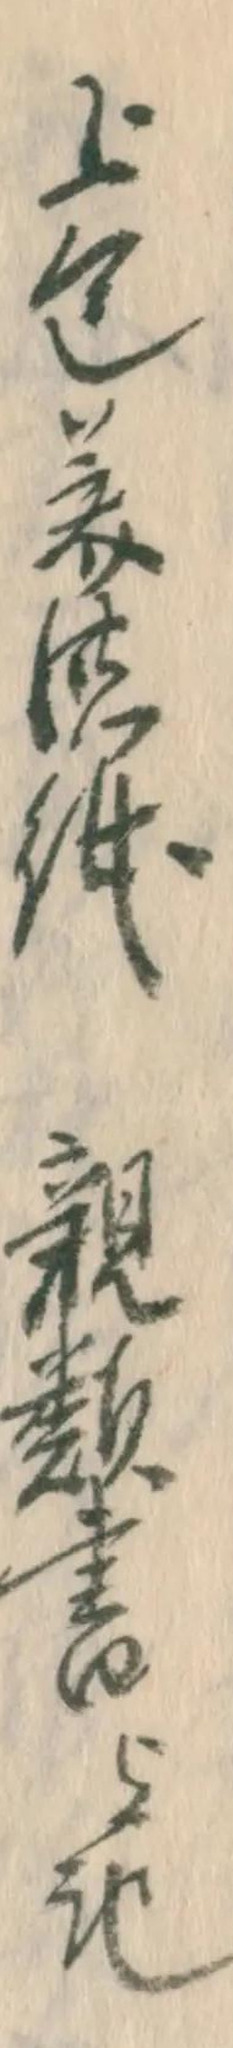上包美濃紙親類書と記
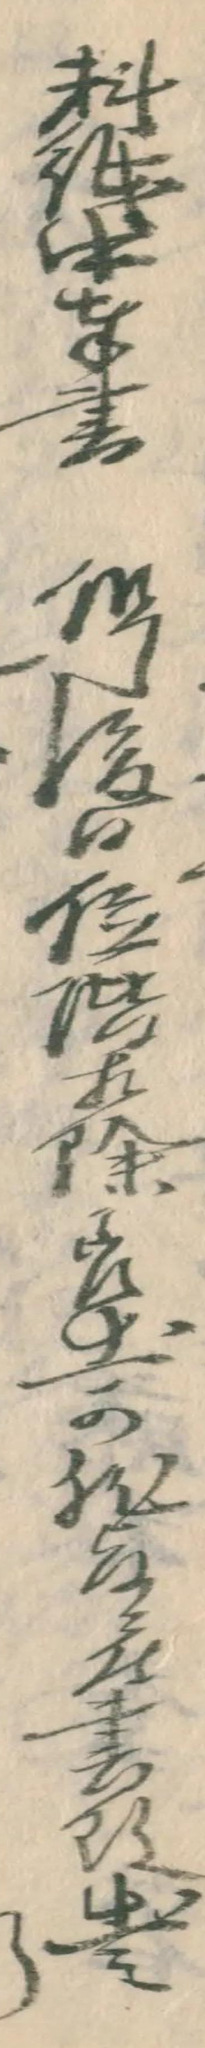料紙中奉書但し後日位階相除差出可然旨ニ付書改出之了

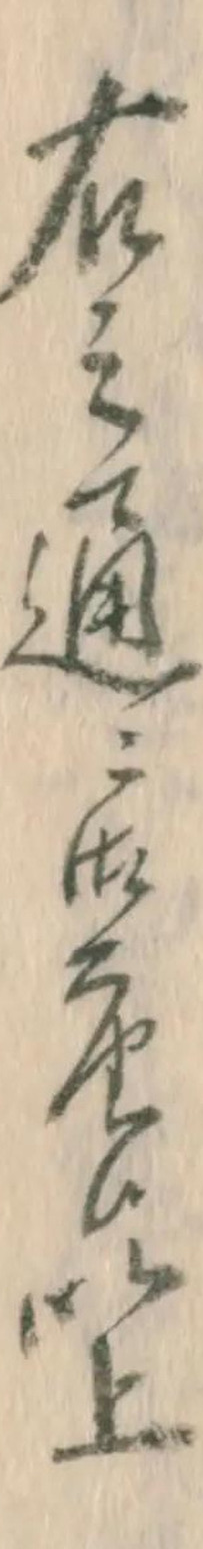右之通ニ御座候以上
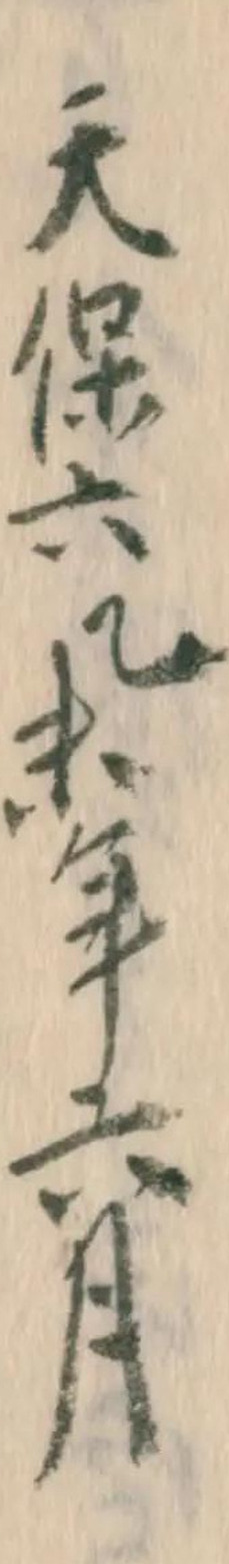天保六乙未年六月
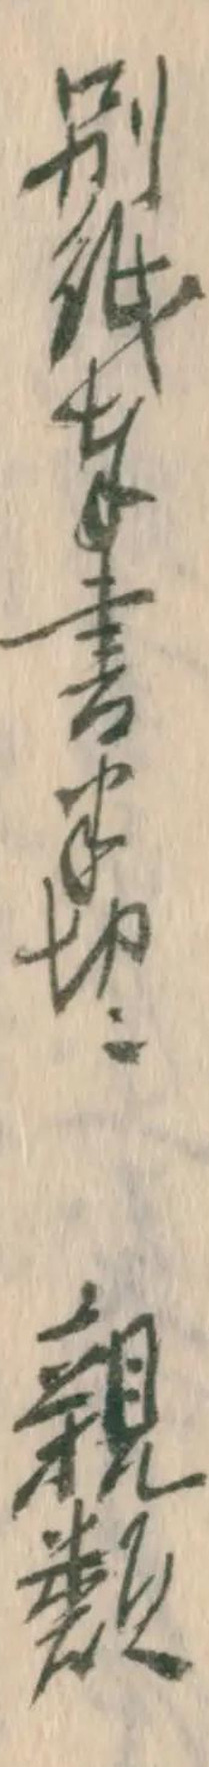別紙奉書半切ニ親類
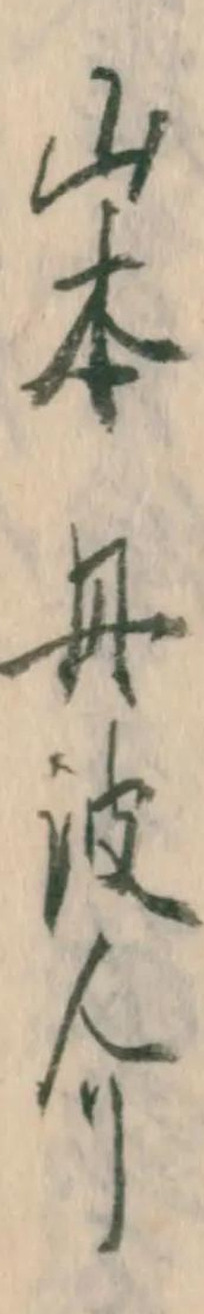山本丹波介
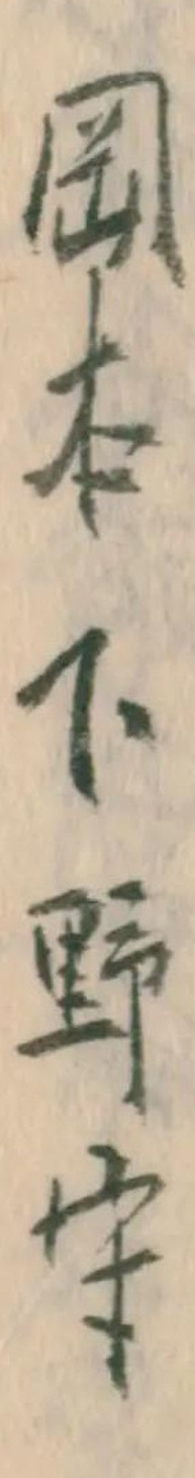岡本下野守
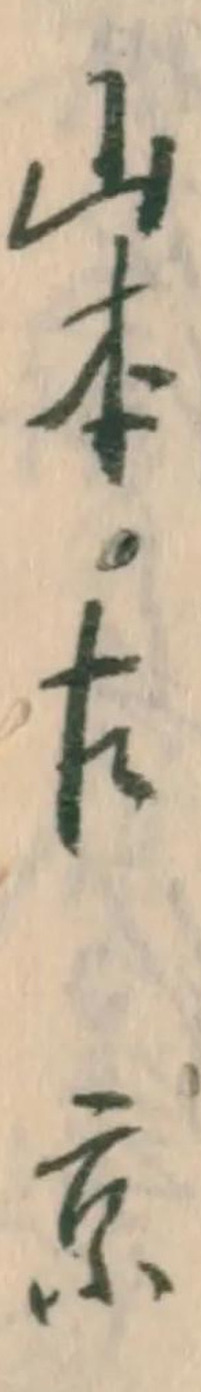山本左京
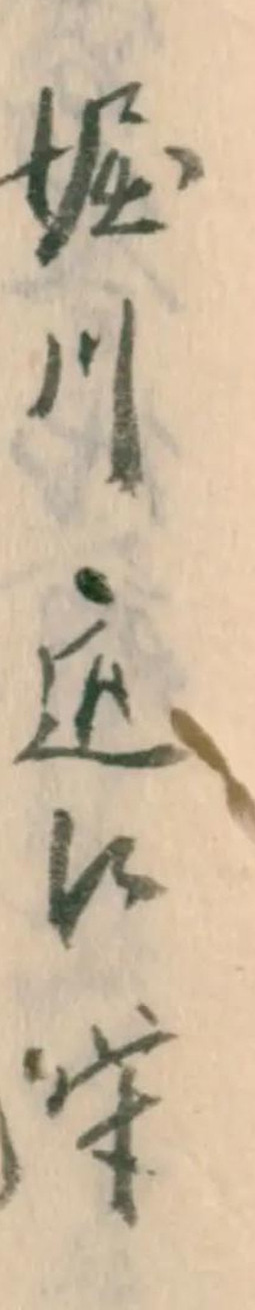堀川近江守
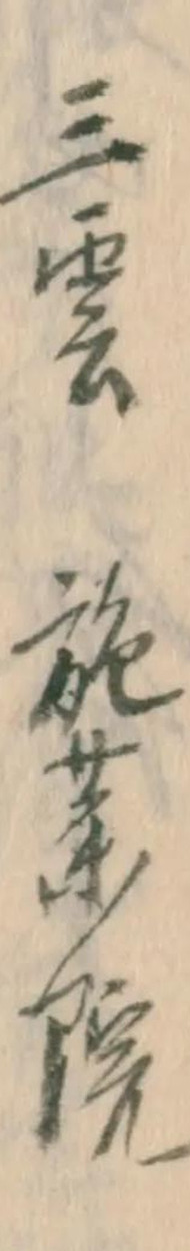三雲施薬院
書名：賀茂社記録. 第67冊
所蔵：国立国会図書館 National Diet Library, JAPAN
